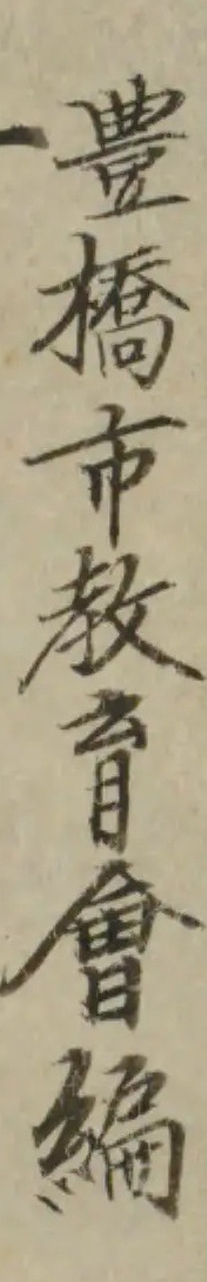豊橋市教育會編
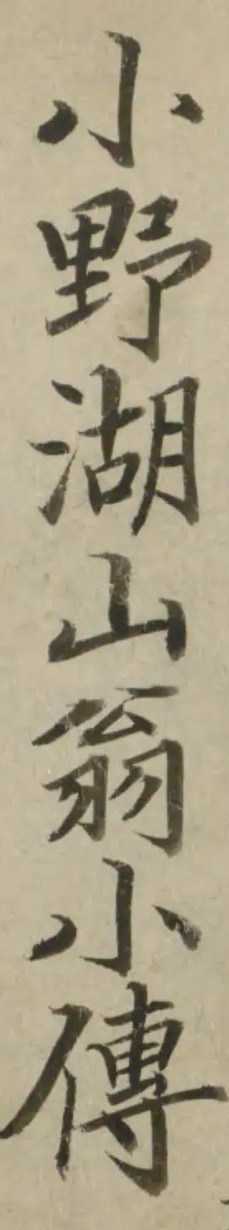小野湖山翁小傳

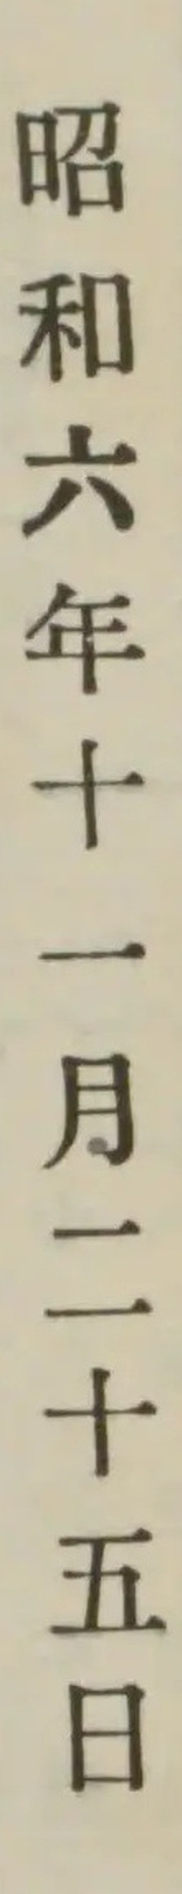昭和六年十一月二十五日
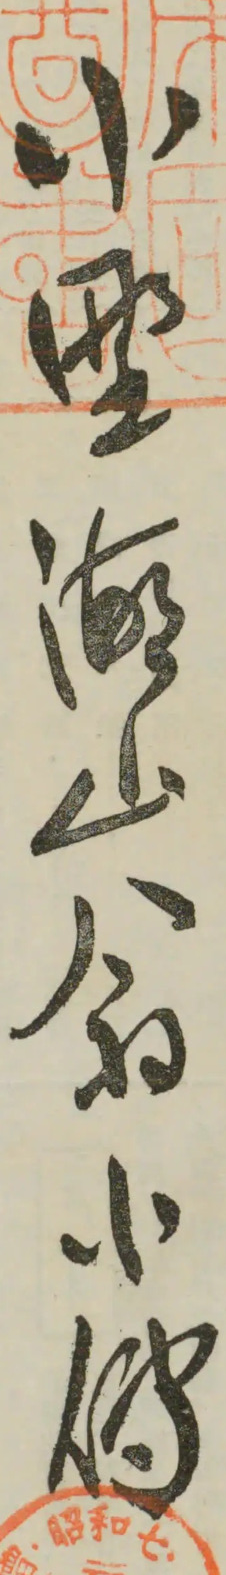小野湖山翁小傳
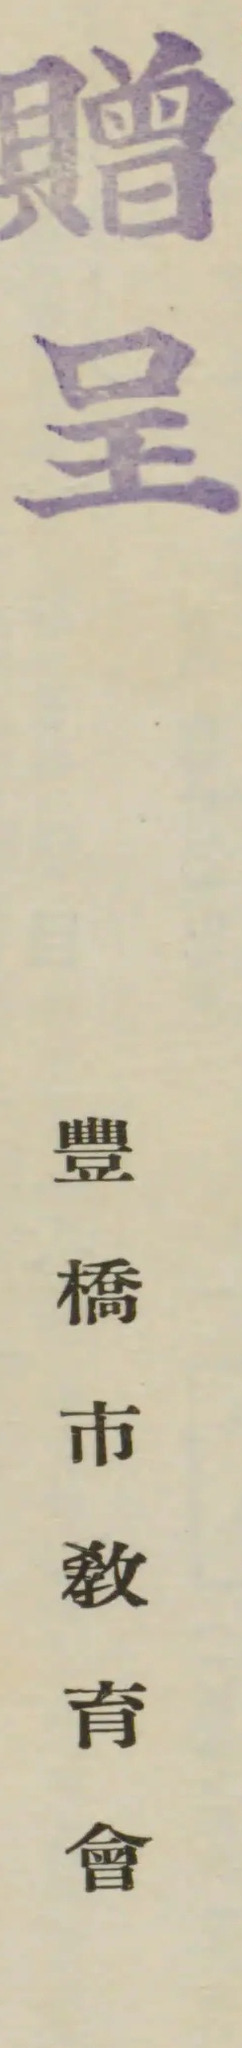豊橋市教育会
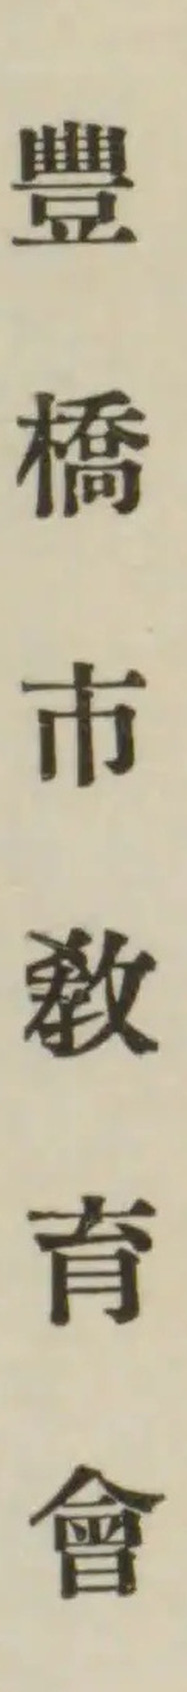豊橋市教育会

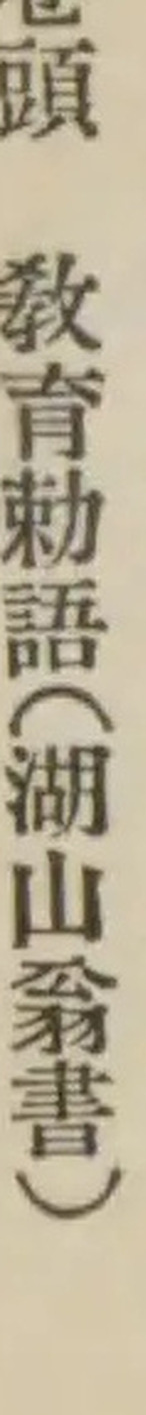巻頭教育勅語(湖山翁書)
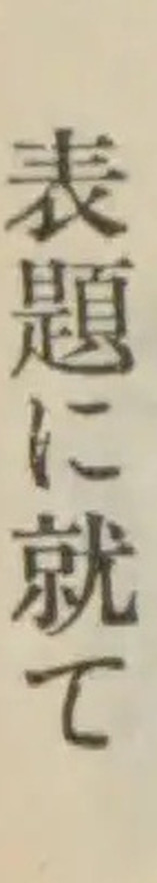表題に就て
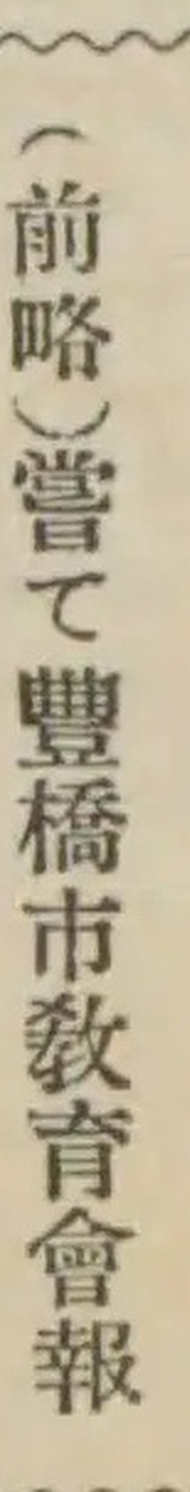(前略)嘗て豊橋市教育会報
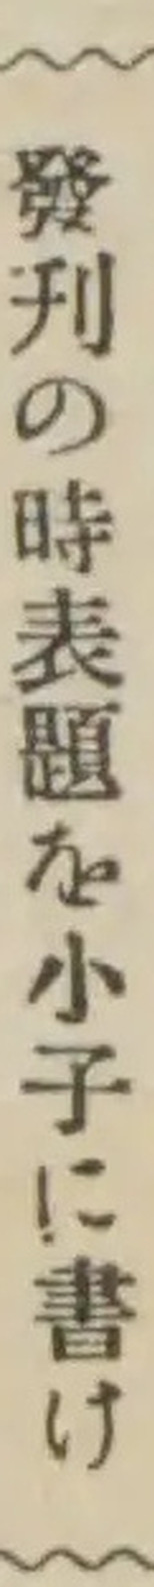発刊の時表題を小子に書け
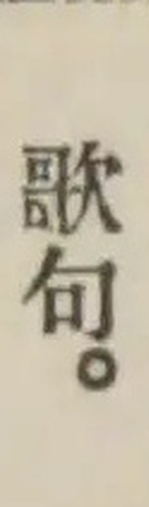歌句。
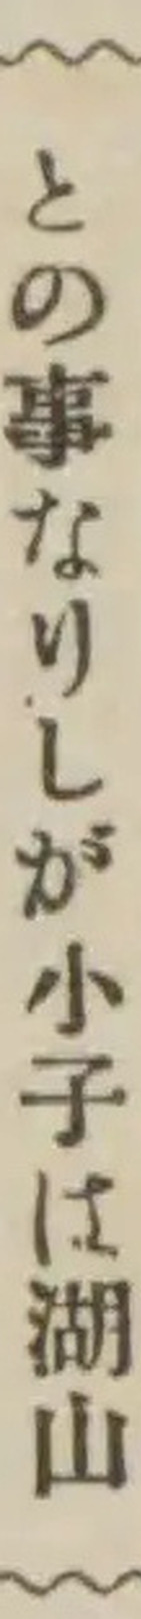との事なりしが小子は湖山
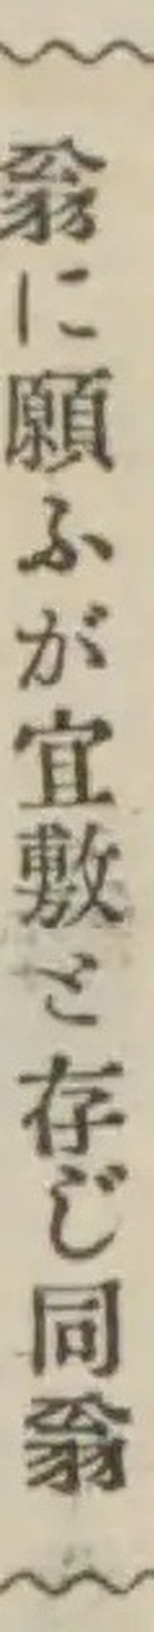翁に願ふが宜敷と存じ同翁
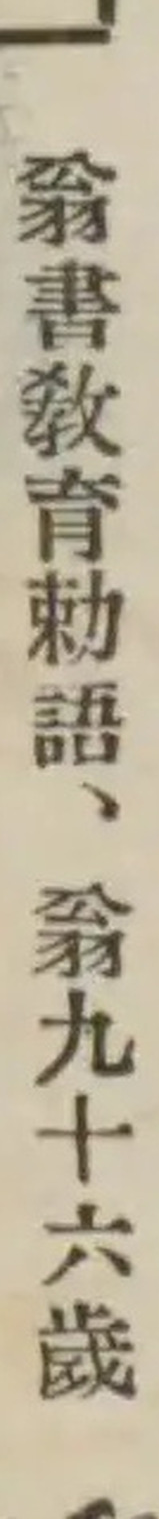写真翁書教育勅語、翁九十六歳
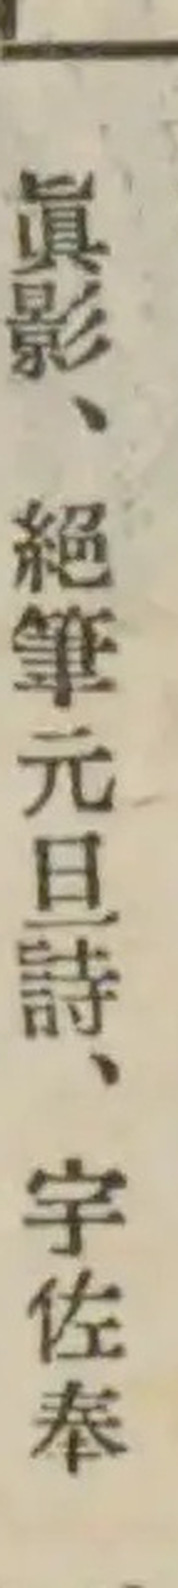真影、絶筆元旦詩、宇佐奉
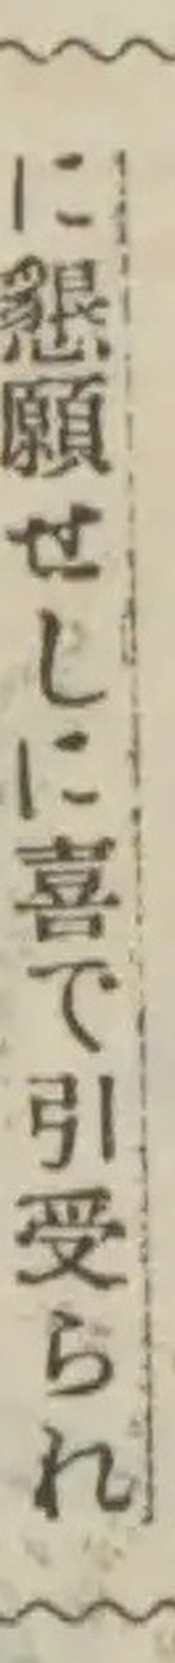に懇願せしに喜で引受られ
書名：小野湖山翁小伝
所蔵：国立国会図書館 National Diet Library, JAPAN
